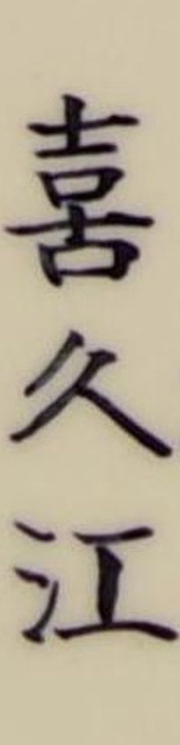喜久江
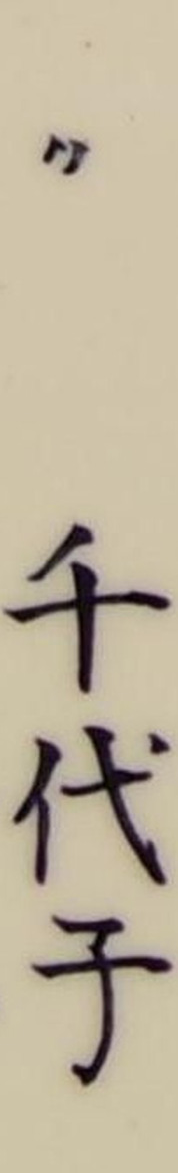千代子
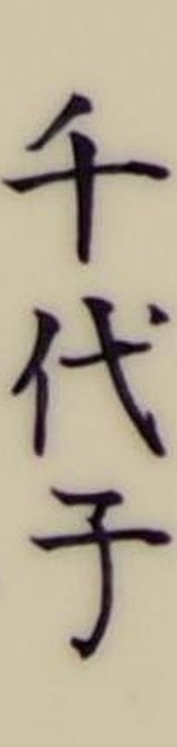千代子
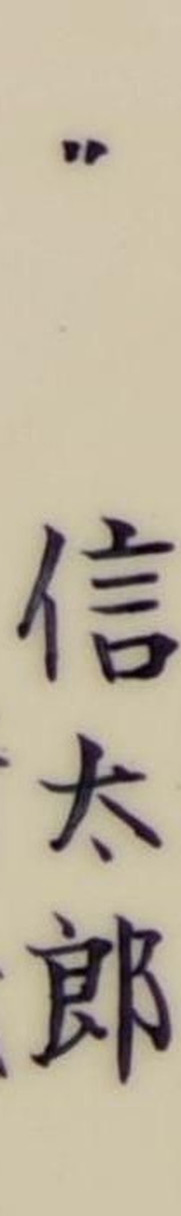信太郎
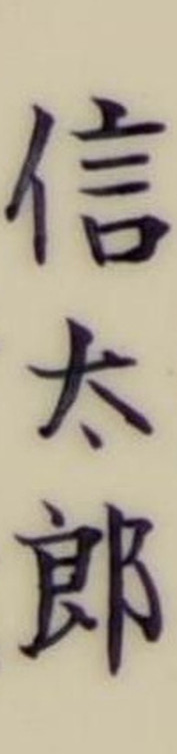信太郎

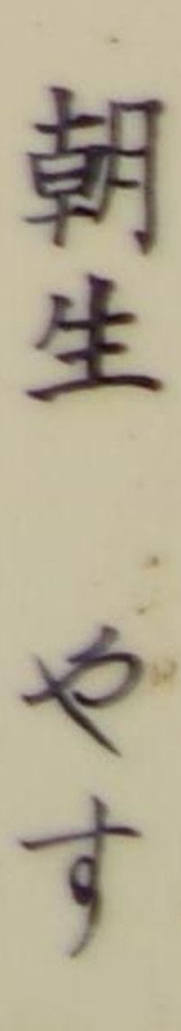朝生やす
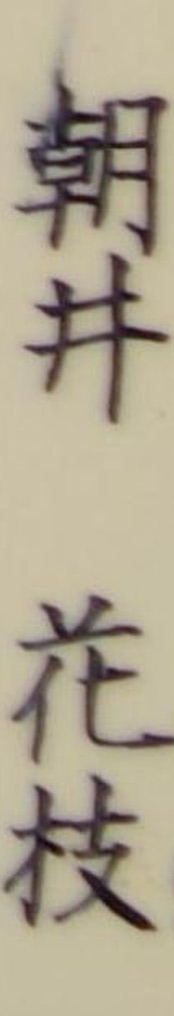朝井花枝
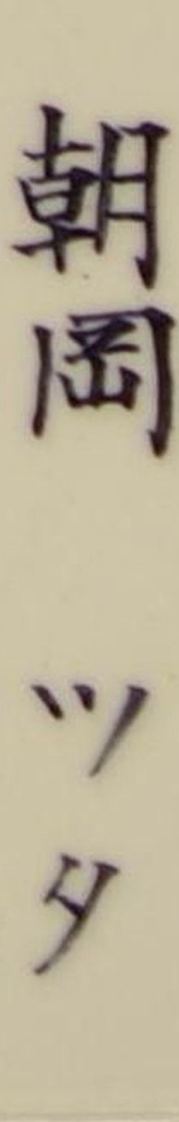朝岡ツタ
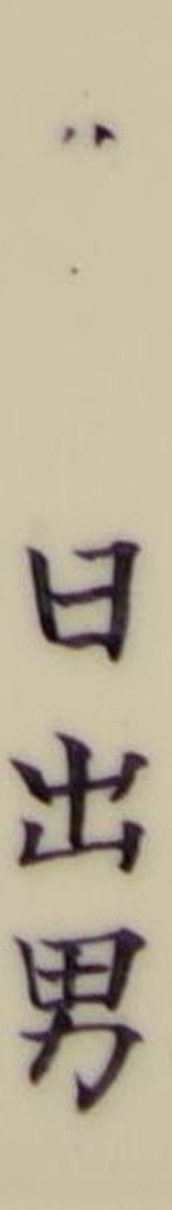日出男
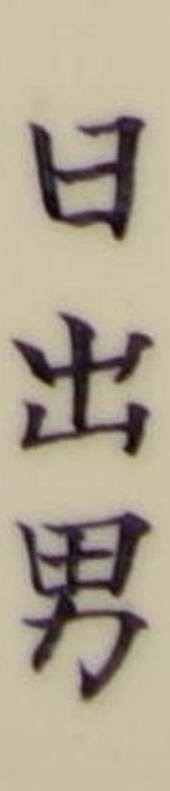日出男
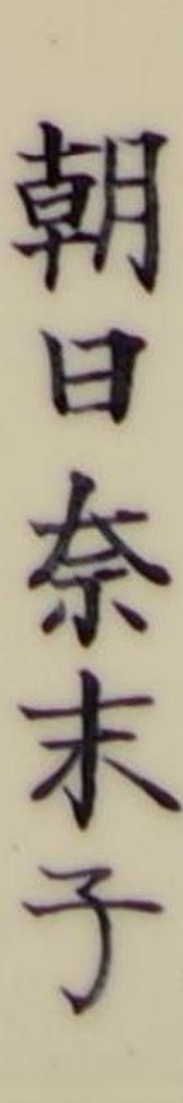朝日奈末子
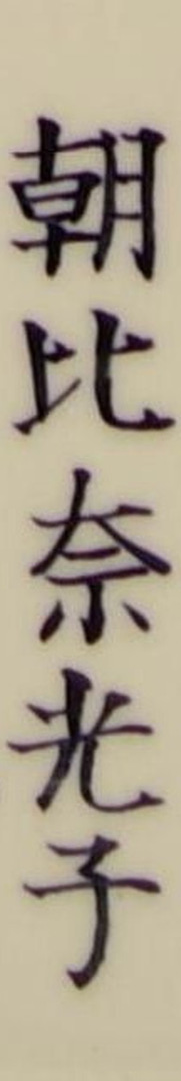朝比奈光子
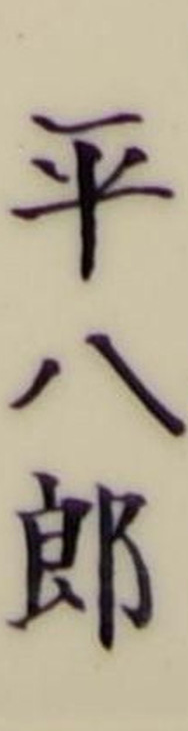平八郎
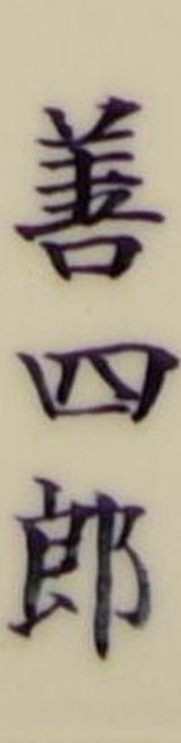善四郎
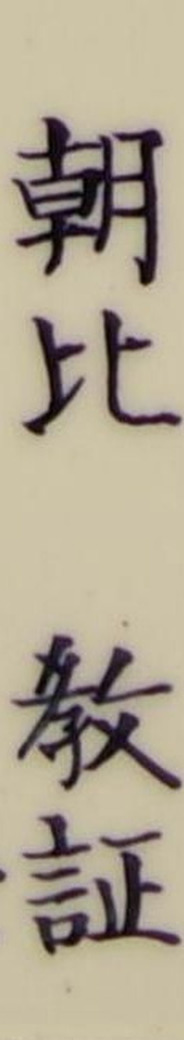朝比教証
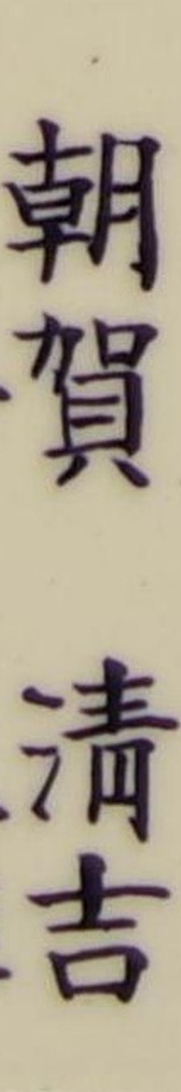朝賀清吉
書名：E~L
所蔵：高野山金剛峯寺
